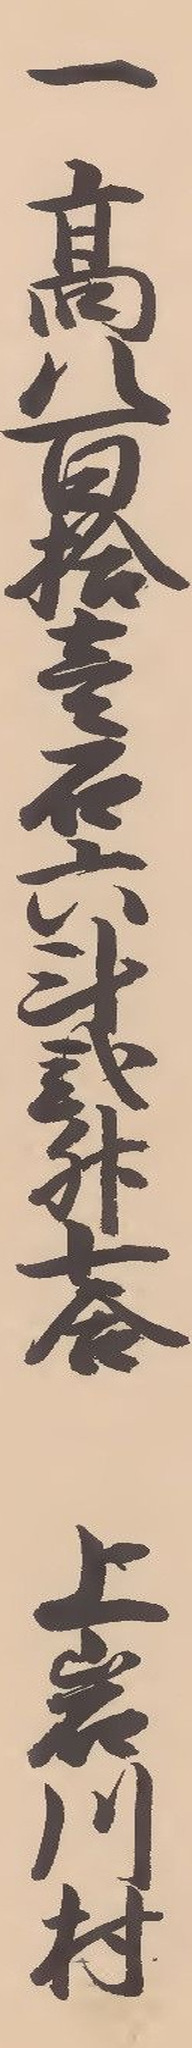一高八百拾壱石六斗弐升七合上岩川村
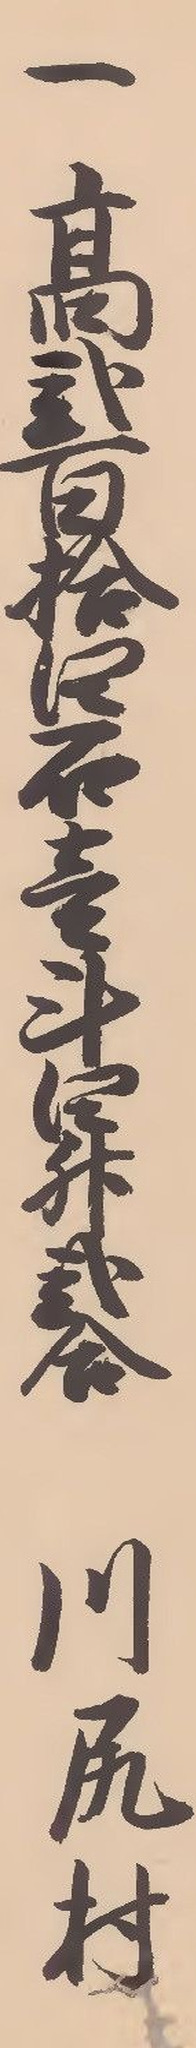一高弐百拾四石壱斗四升弐合川尻村
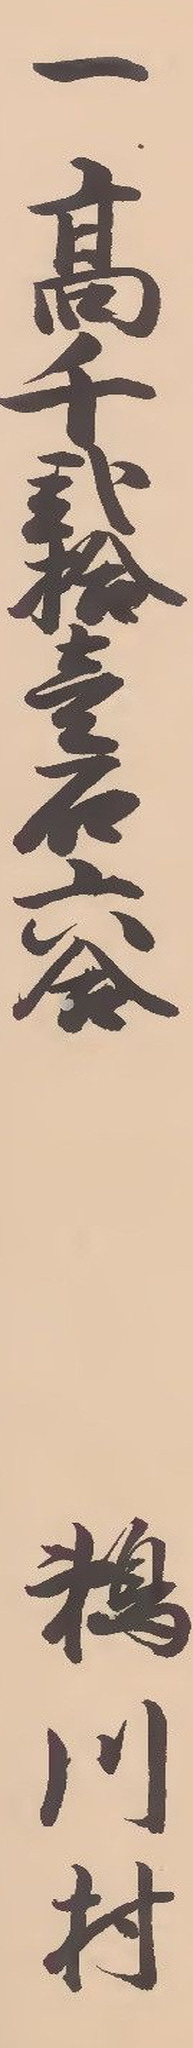一高千弐拾壱石六合鵜川村
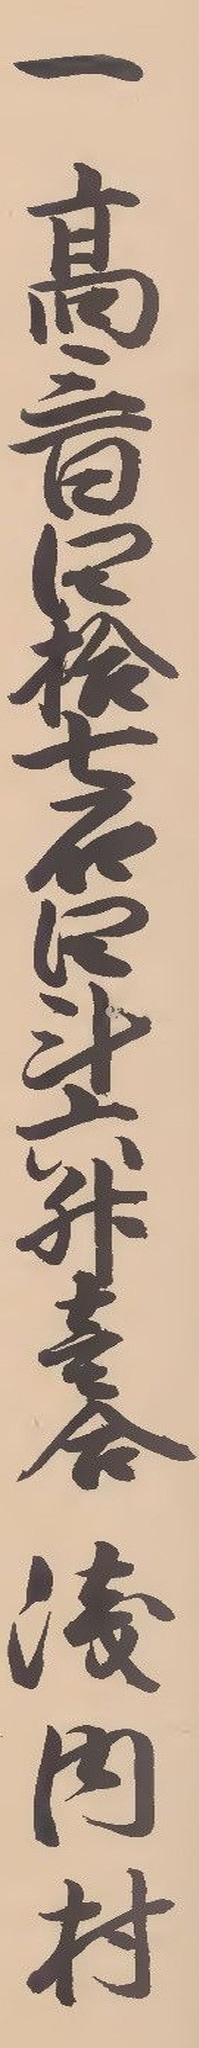一高三百四拾七石四斗六升壱合浅内村
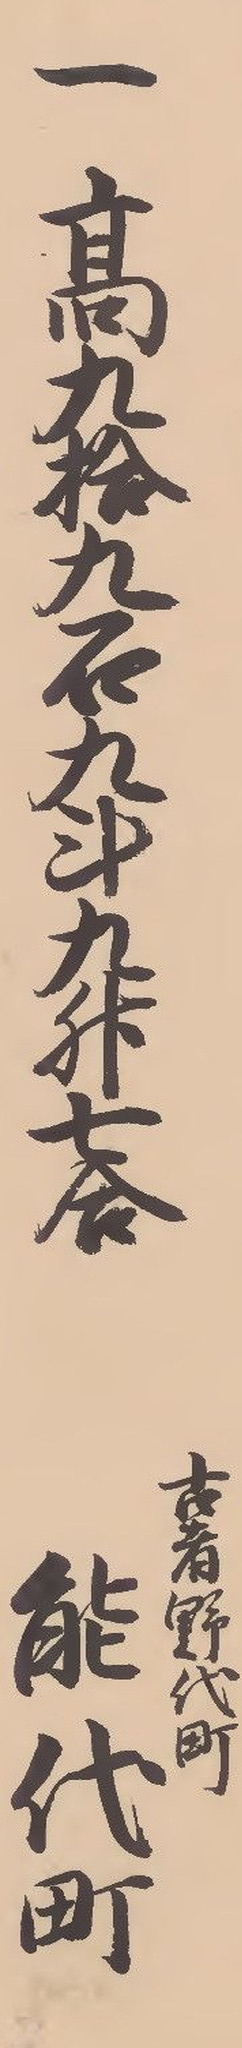一高九拾九石九斗九升七合能代町
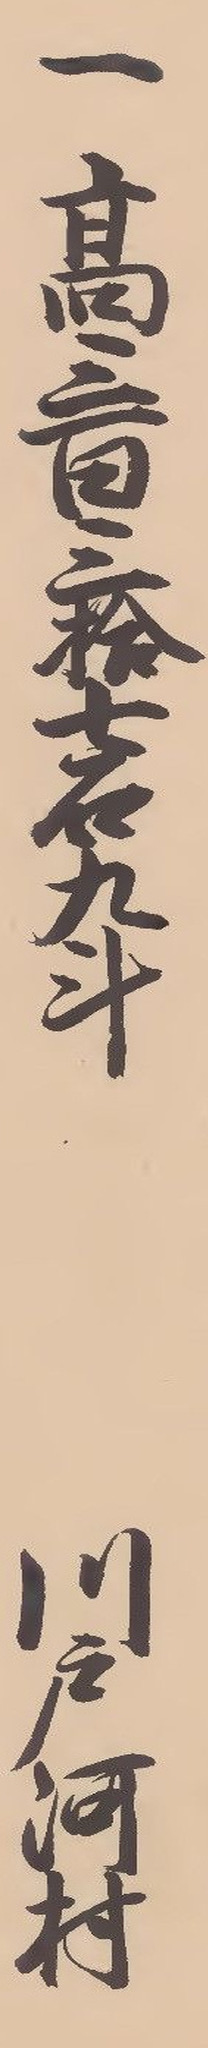一高三百三拾七石九斗川戸河村
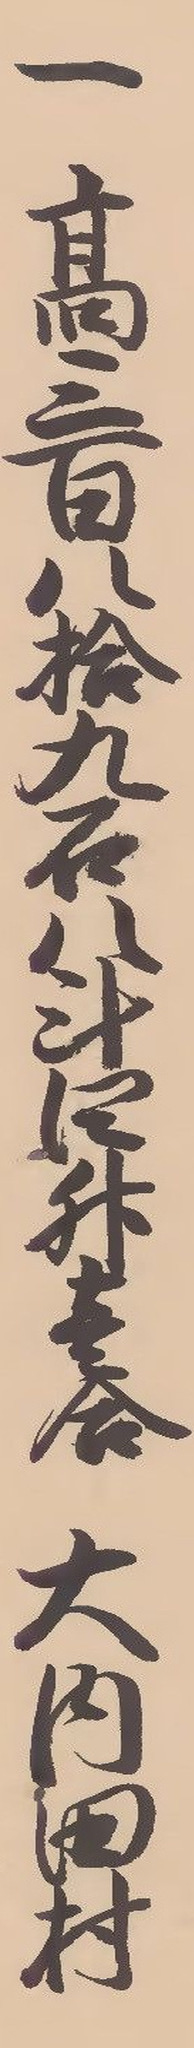一高三百八拾九石八斗四升壱合大内田村

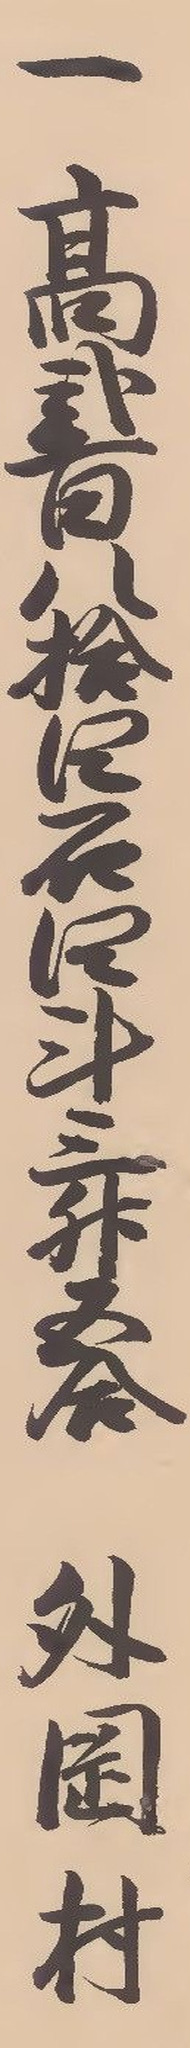一高弐百八拾四石四斗三升五合外岡村
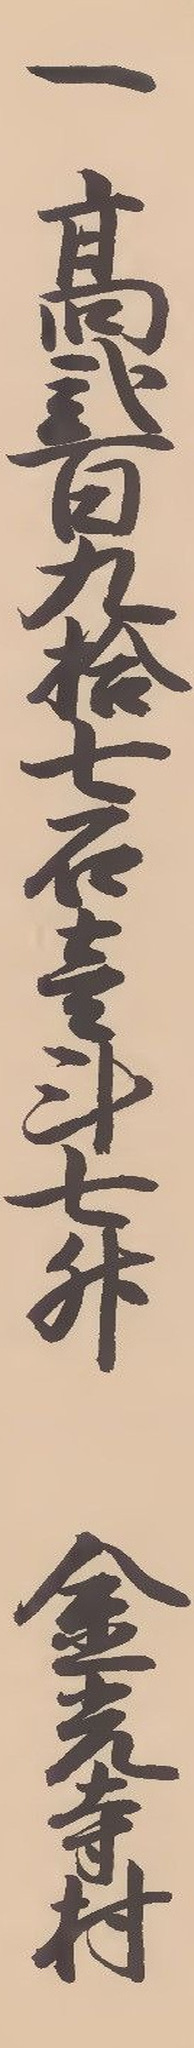一高弐百九拾七石壱斗七升金光寺村
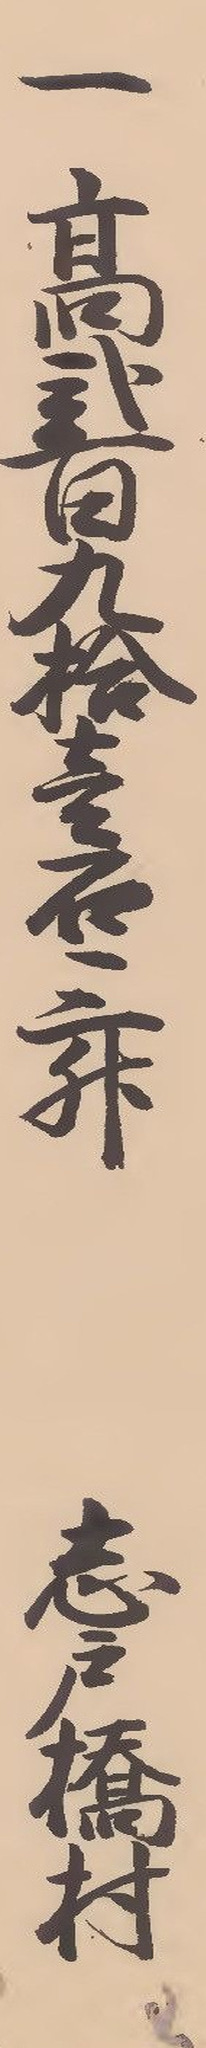一高弐百九拾壱石三升志戸橋村
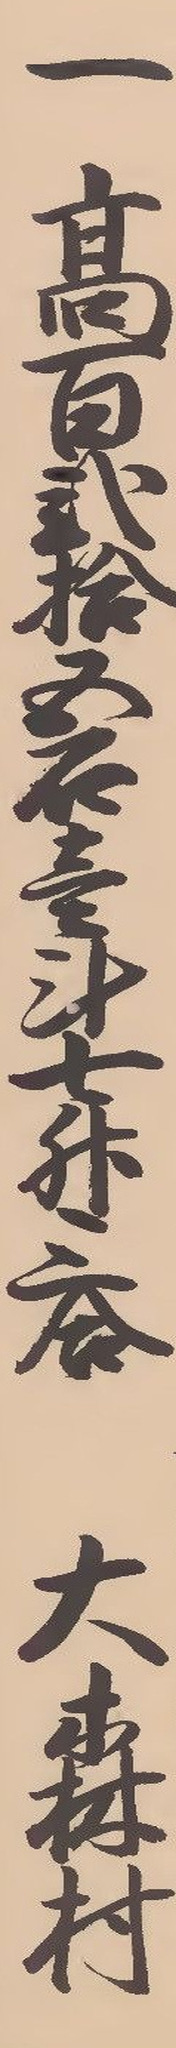一高百弐拾五石壱斗七升三合大森村
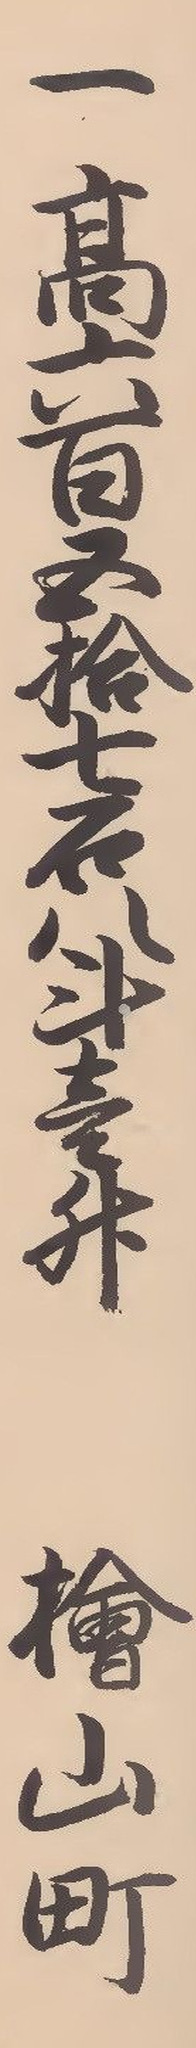一高六百五拾七石八斗壱升桧山町
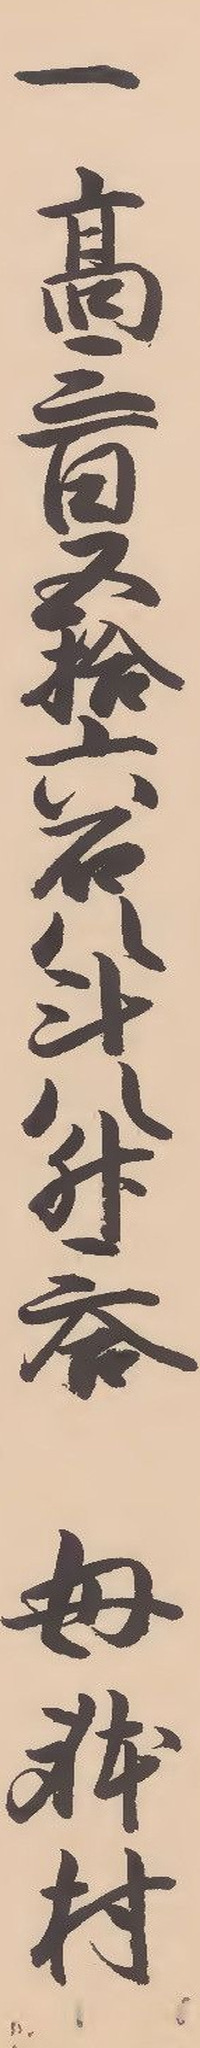一高三百五拾六石八斗八升三合母体村
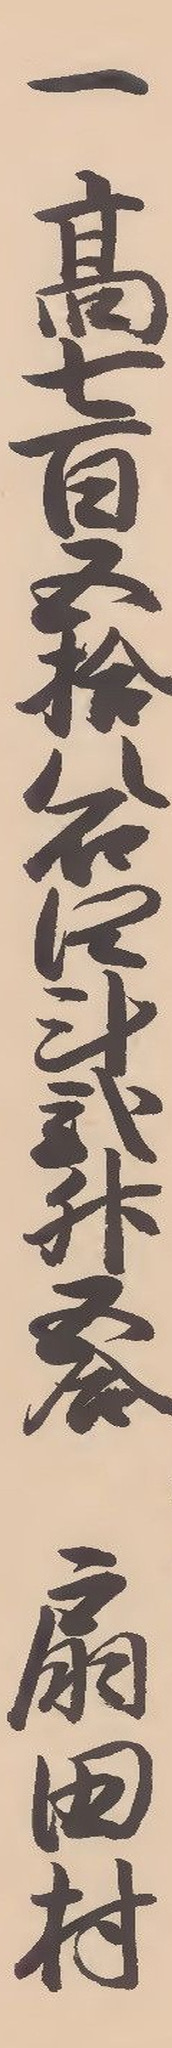一高七百五拾八石四斗弐升五合扇田村
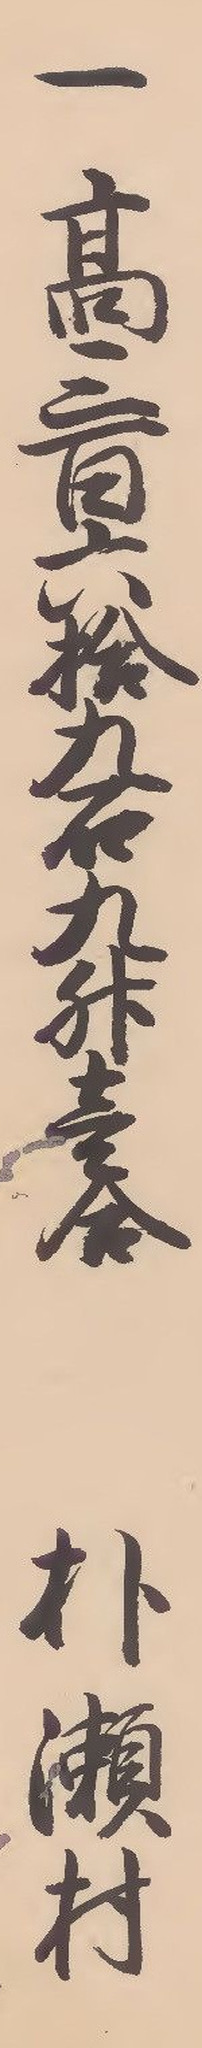一高三百六拾九石九升壱合朴瀬村

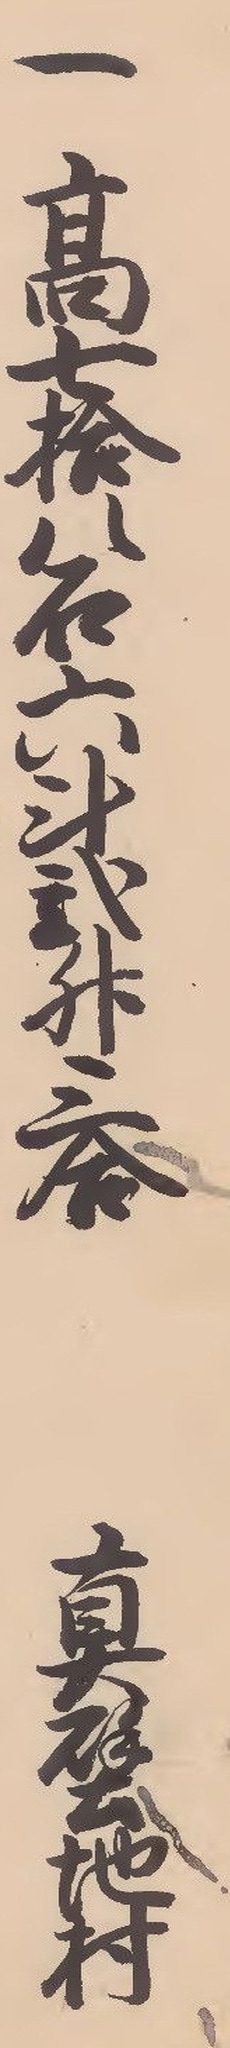一高七拾八石六斗弐升三合真壁地村
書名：出羽国郷帳　５
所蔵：国立公文書館 National Archives of Japan
